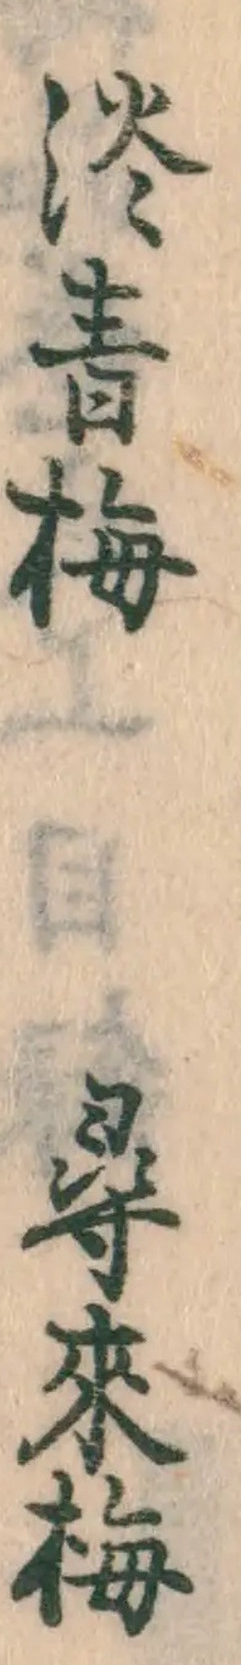淡青梅尋来梅
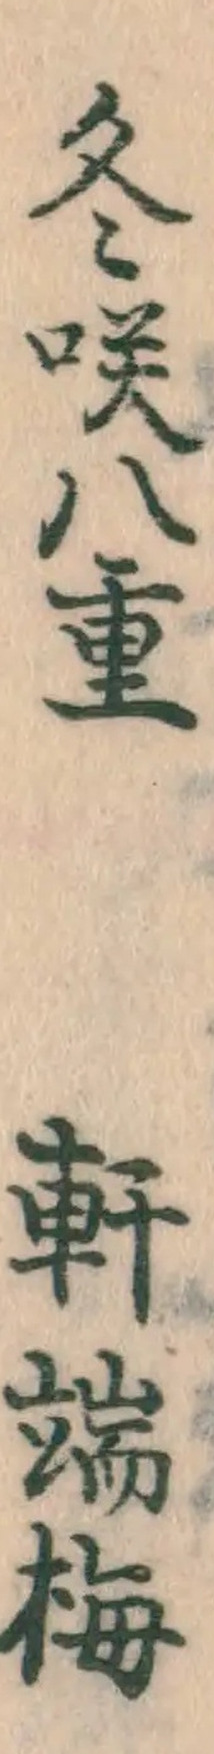冬咲八重軒端梅
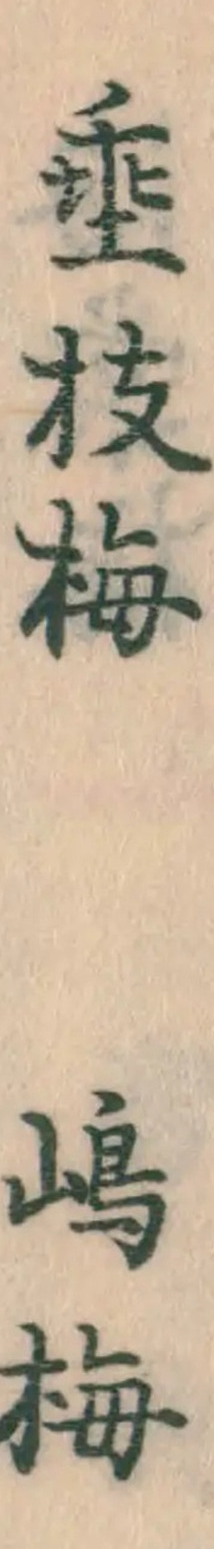垂枝梅島梅
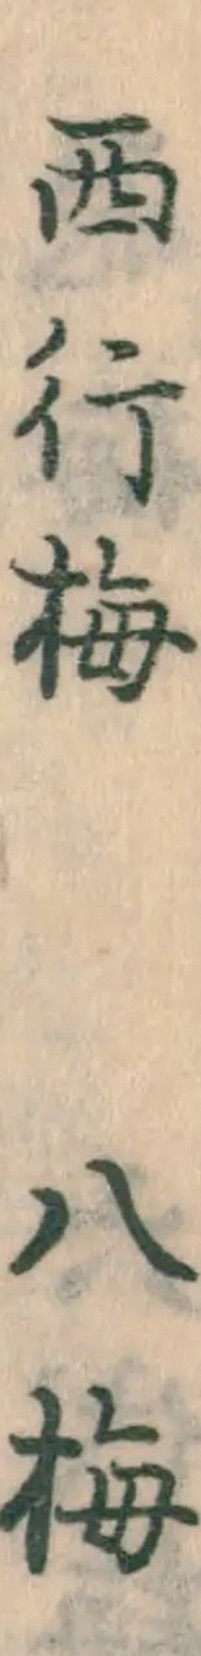西行梅八梅
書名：怡顔斎梅品 2巻. [1]
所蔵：国立国会図書館 National Diet Library, JAPAN
